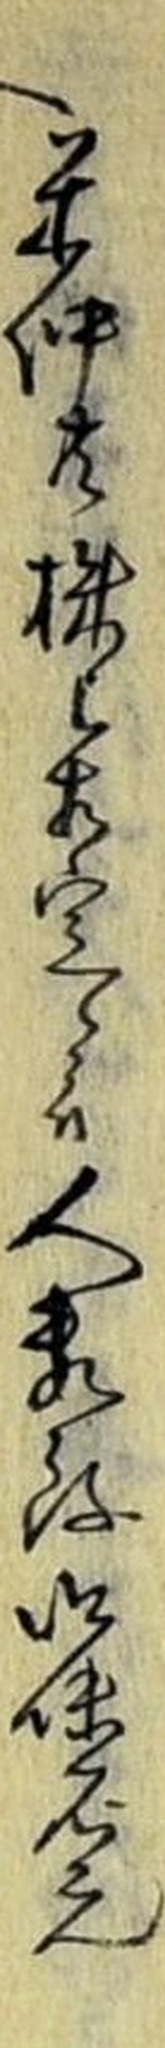米仲共株主相定候に付人数致吟味名元米町
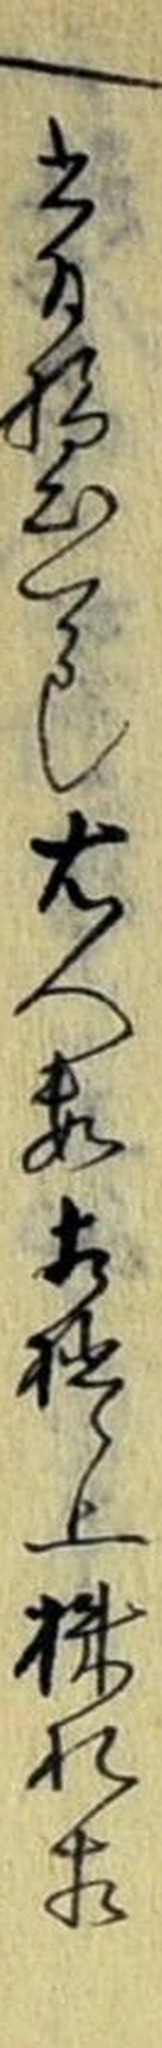書付指出可申候右人数相極候上株札相小商共
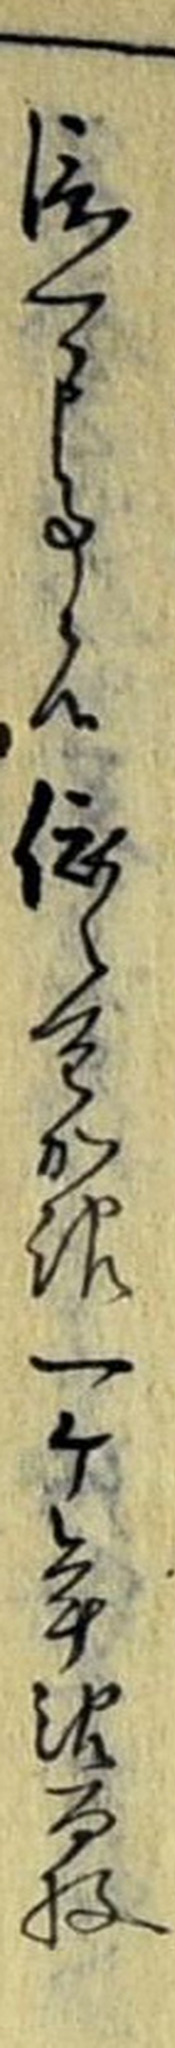渡可申事に候依之冥加銀一ヶ年銀百枚米仲共
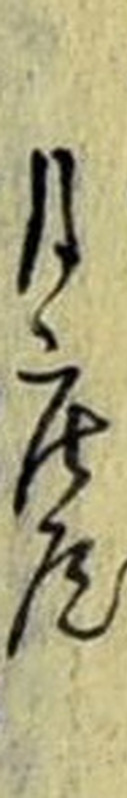月庄屋
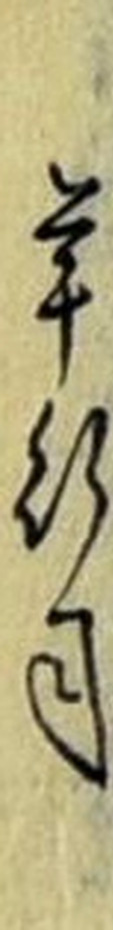年行司

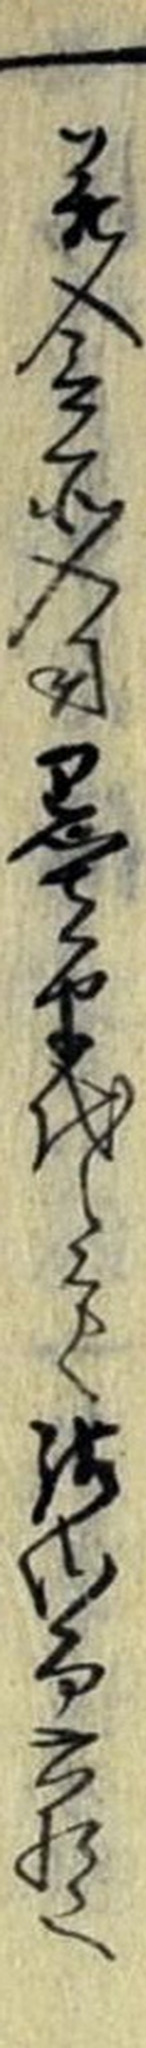并会所入用墨筆代之方へ銀弐百六拾匁
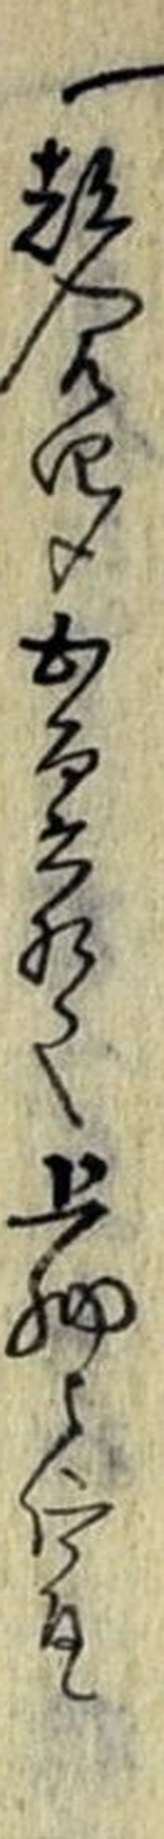都合四〆五百六拾匁上納被仰付候
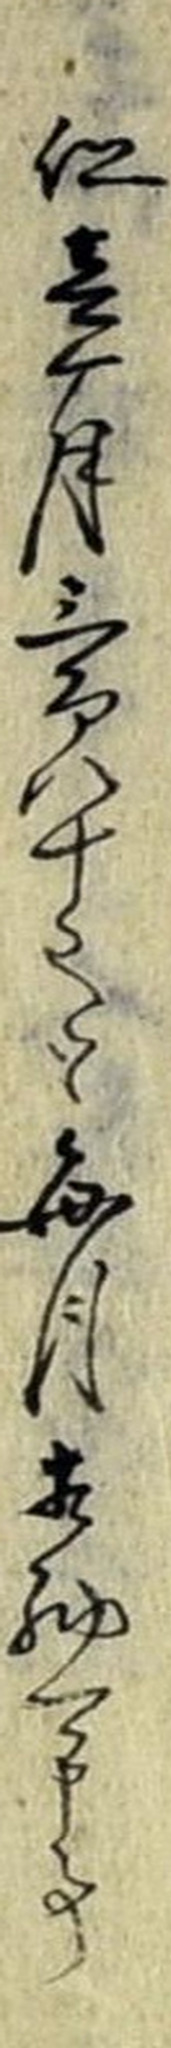但壱ヶ月銀三百八拾匁つヽ毎月相納可申事
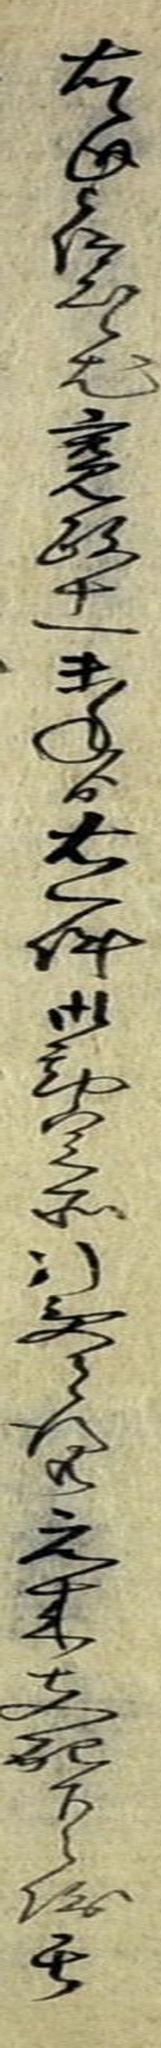右之趣被仰出候尤寛政十一未年ゟ右一件御勘定所引受候得共元来支配下之儀其
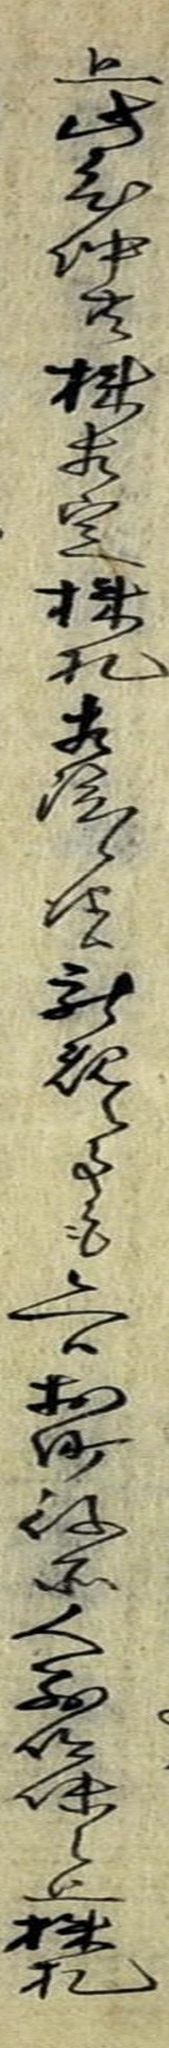上此度仲共株相定株札相渡候儀は新規之事にも候へは於町役所人別吟味之上株札
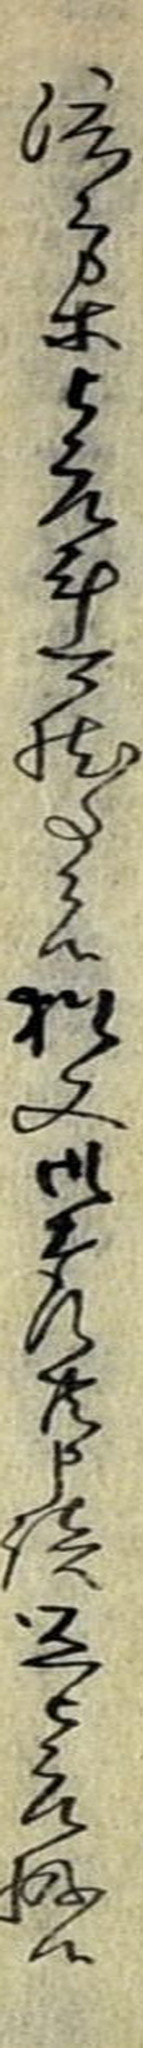渡方等被取斗可然事に候猶又御奉行共申談宜被取扱候
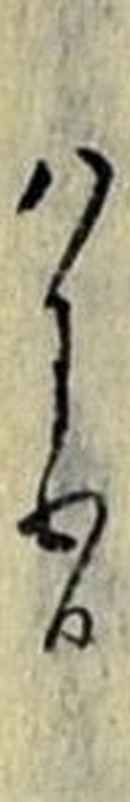八月五日
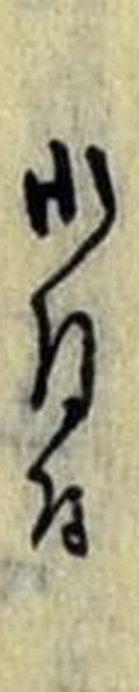御目付
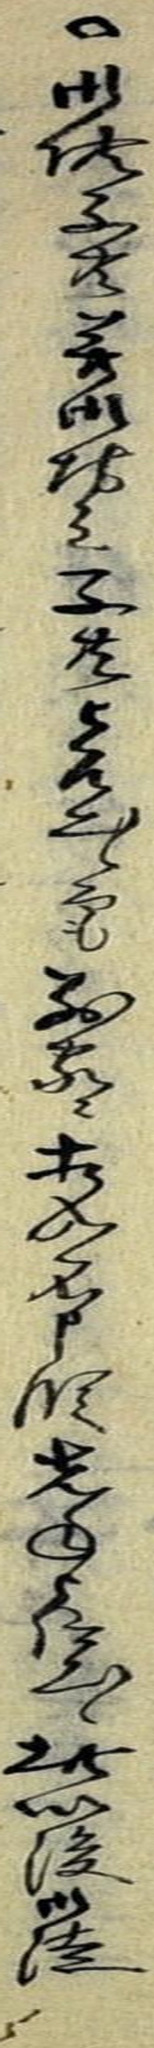○御供子共并御坊主子共被差出候而も別家に相成不申段先年被仰出候此以後御徒
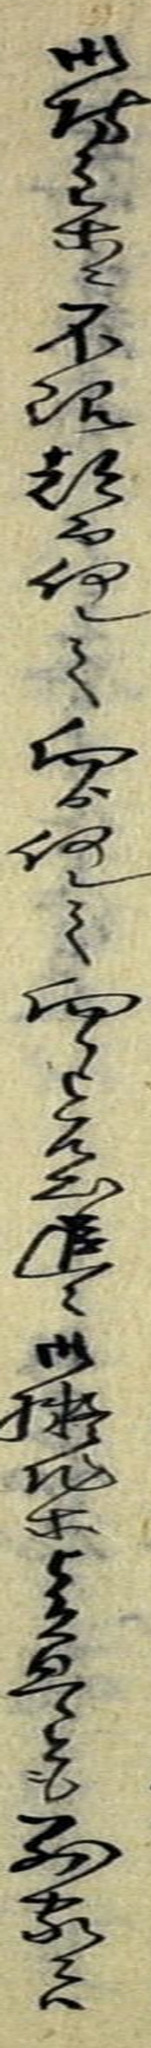御坊主等に不限都而何レ〳〵之向ゟ何レ〳〵之向被差出追々御擬作等被下置候とも別家には
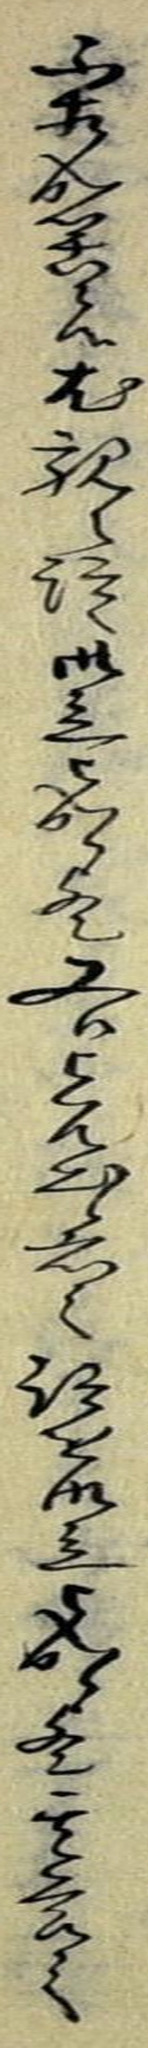不相成筈に候尤親之跡へ御立被成候歟又は被召出候者之跡を御立被成候歟其節々之
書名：命令之部 四
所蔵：福井県文書館 Fukui Prefectural Archives
